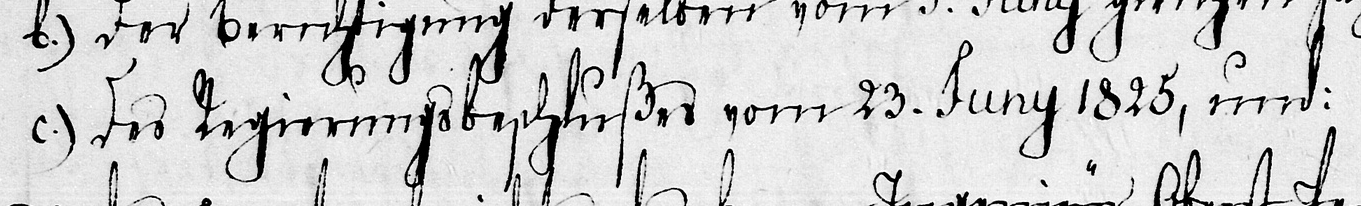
c.) Des Regierungsbeschlußes vom 23. Juny 1825, und:
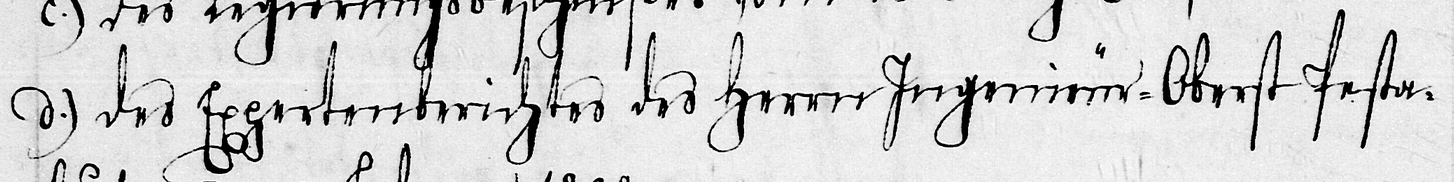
d.) das Expertenberichtes des Herrn Ingenieur-Oberst Pesta¬
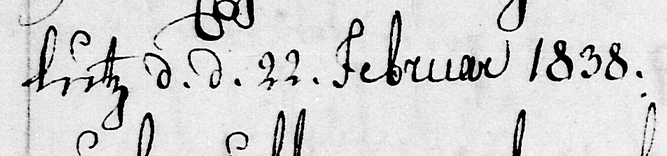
lutz d. d. 22. Februar 1838.
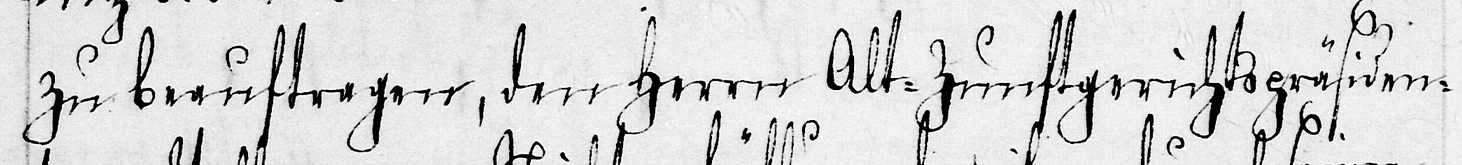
zu beauftragen, den Herrn Alt-Zunftgerichtspräsiden¬
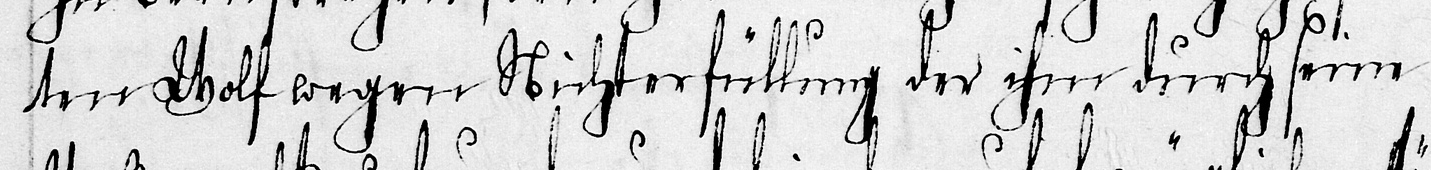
ten Wolf wegen Nichterfüllung der ihm durch seine
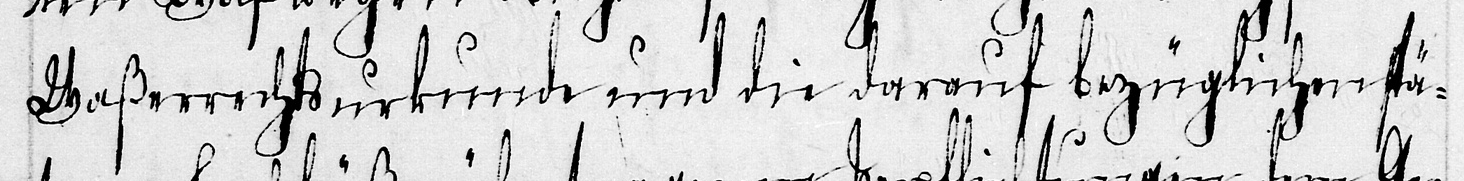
Waßerrechtsurkunde und die darauf bezüglichen spä¬
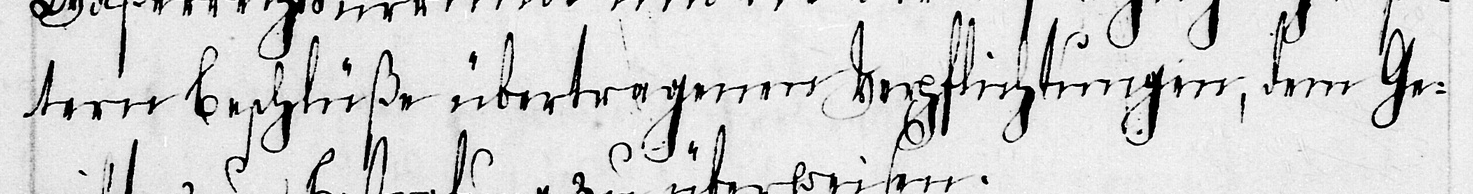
tern Beschlüße übertragenen Verpflichtungen, dem Ge¬
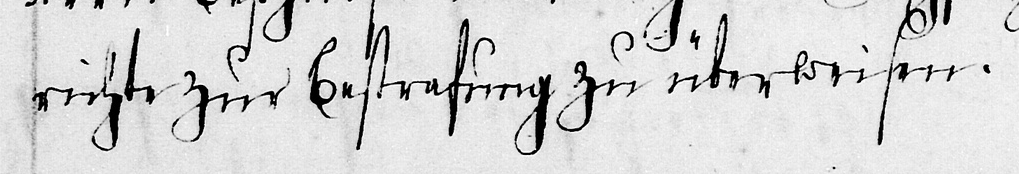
richte zu Bestrafung zu überweisen.
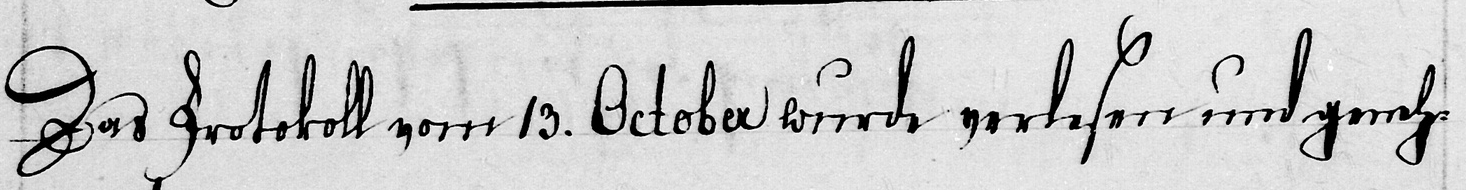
Das Protokoll vom 13. October wurde verlesen und geneh¬
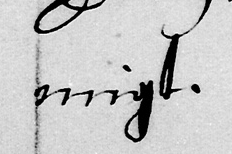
migt.
